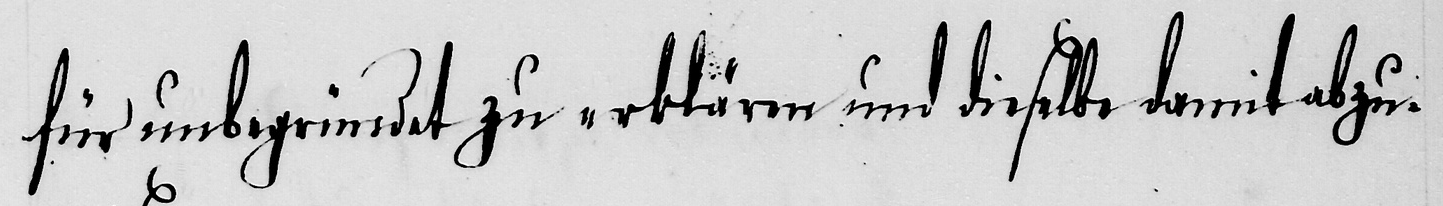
für unbegründet zu erklären und dieselbe damit abzu¬
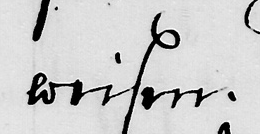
weisen.
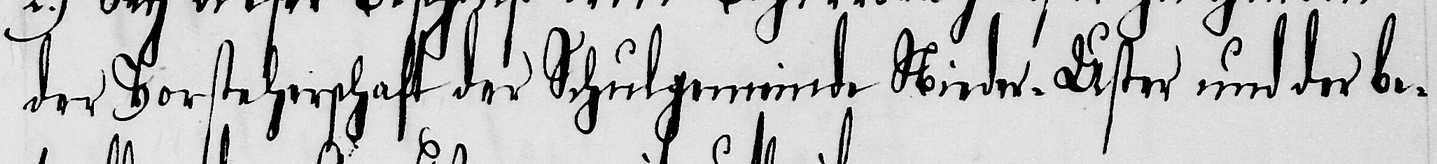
der Vorsteherschaft der Schulgemeinde Nieder-Uster und der be¬
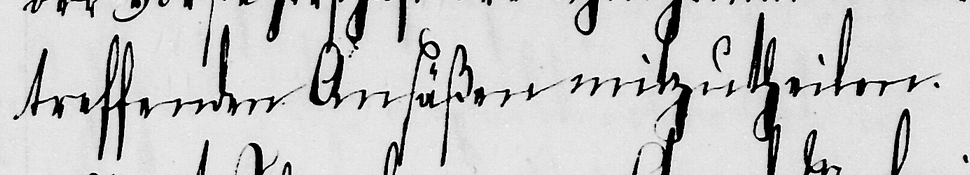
treffenden Ansäßen mitzutheilen.
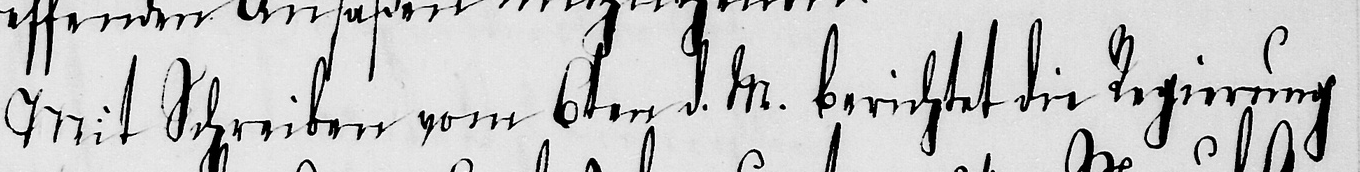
Mit Schreiben vom 6ten d. M. berichtet die Regierung
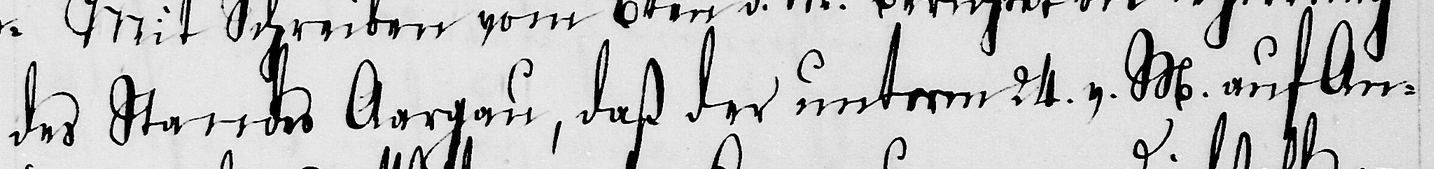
des Standes Aargau, daß der unterm 24. v. M. auf An¬
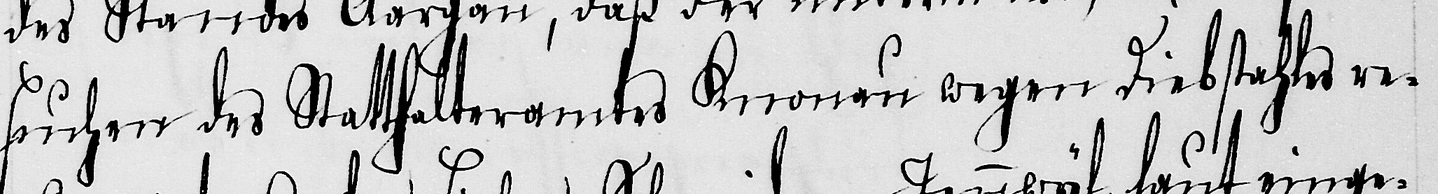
suchen des Statthalteramtes Knonau wegen Diebstahles re¬
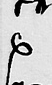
e.
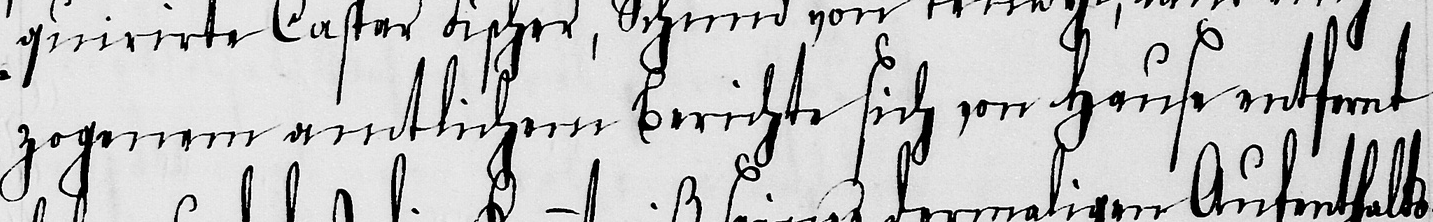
zogenem amtlichem Bericht sich von Hause entfernt
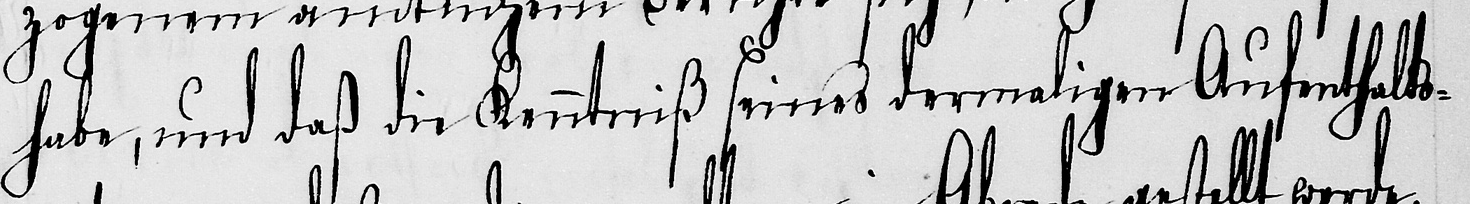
habe, und daß die Kenntniß seines dermaligen Aufenthalts¬
